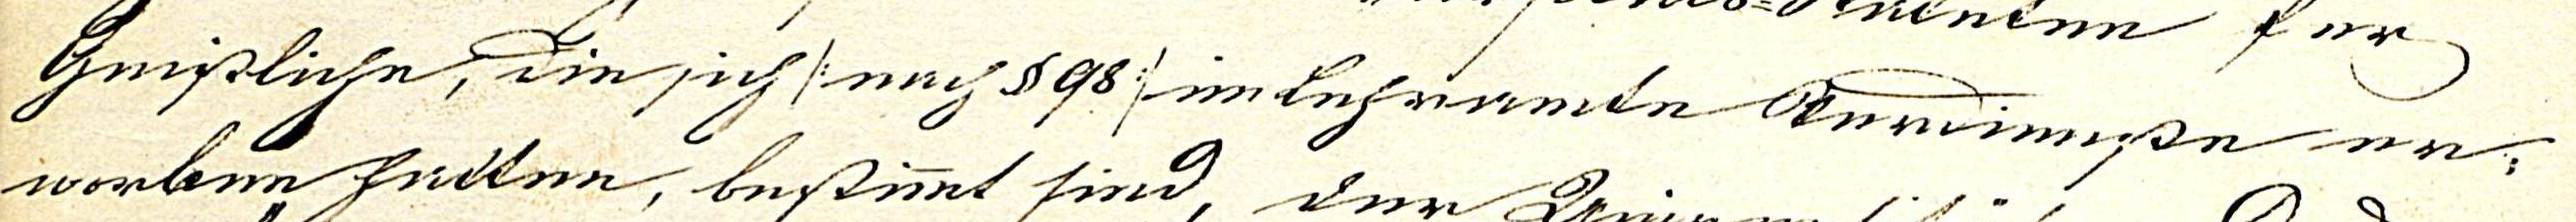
Geistliche, die sich /:nach § 98:/ im Lehramte Verdienste er¬
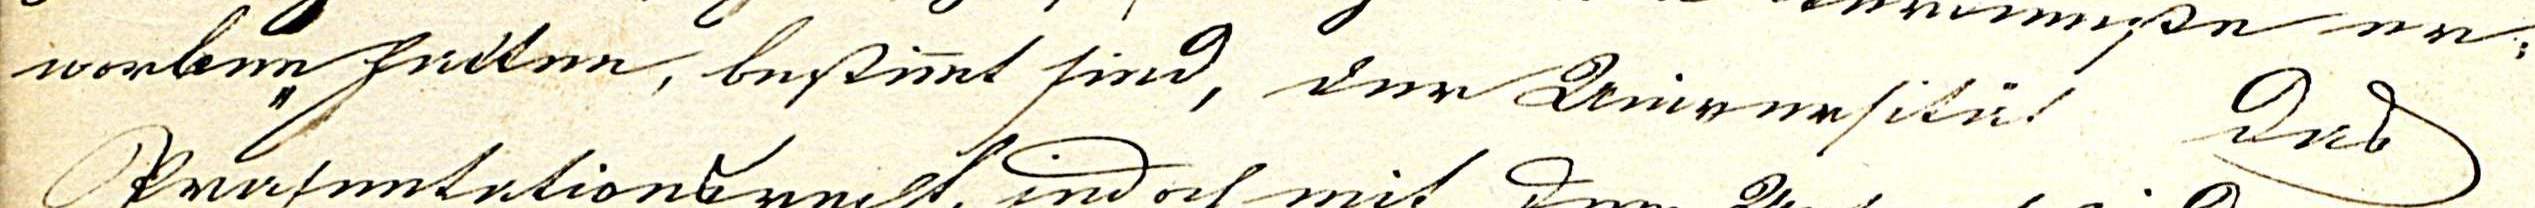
worben hatten, bestimmt sind der Universität das
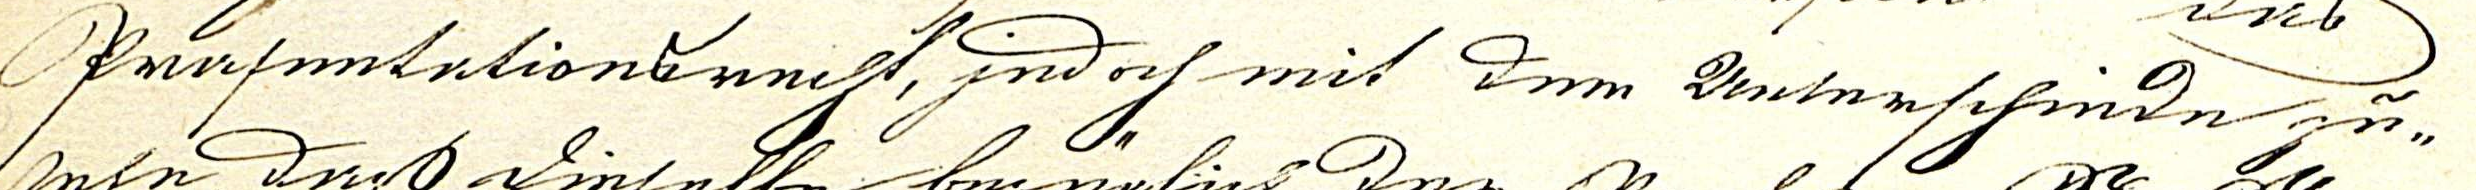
Präsentationsrecht, jedoch mit dem Unterschiede zu¬
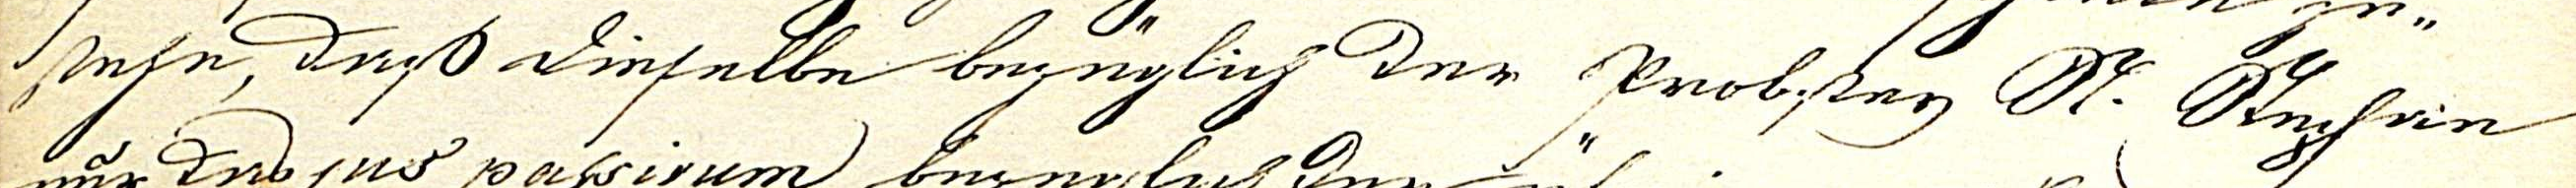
stehe, daß dieselbe bezüglich der Probstey St. Stephan
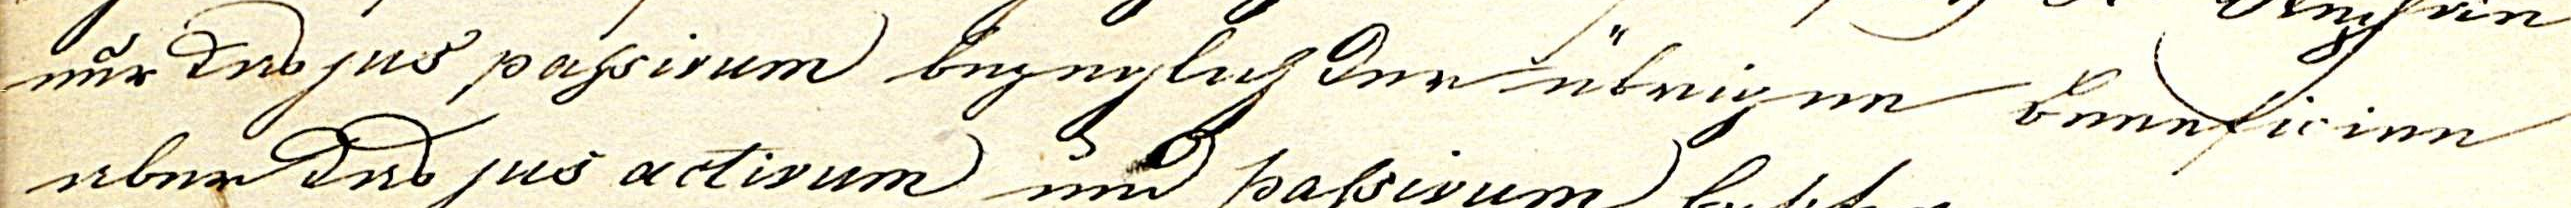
nur des jus passivum bezeglich der übrigen Beneficien
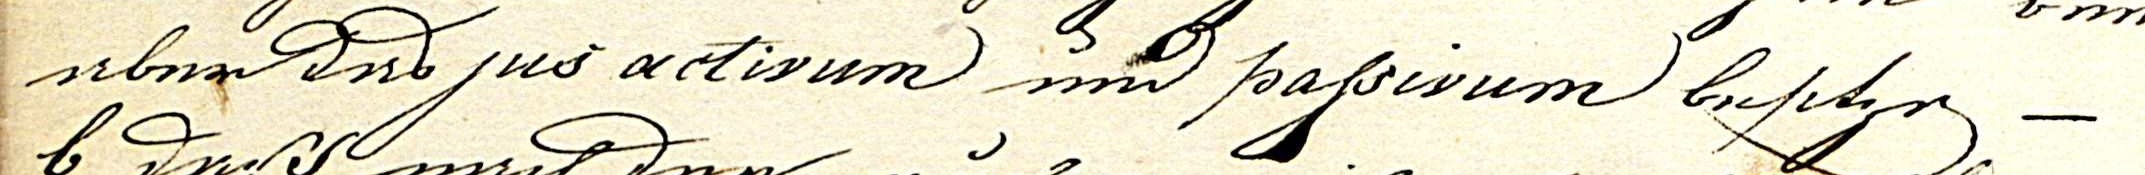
aber dasw jus activum und passivum besitze -
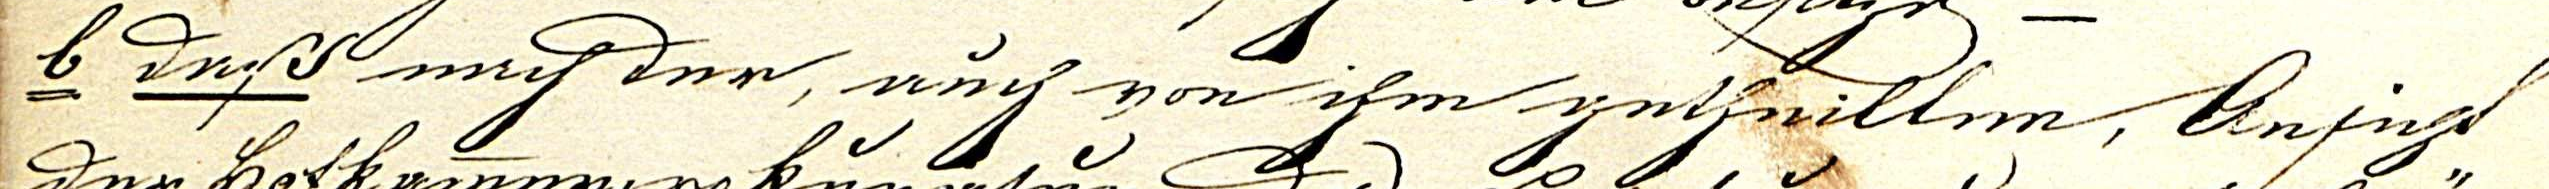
b daß nach der, auch von ihm getheilten, Ansich
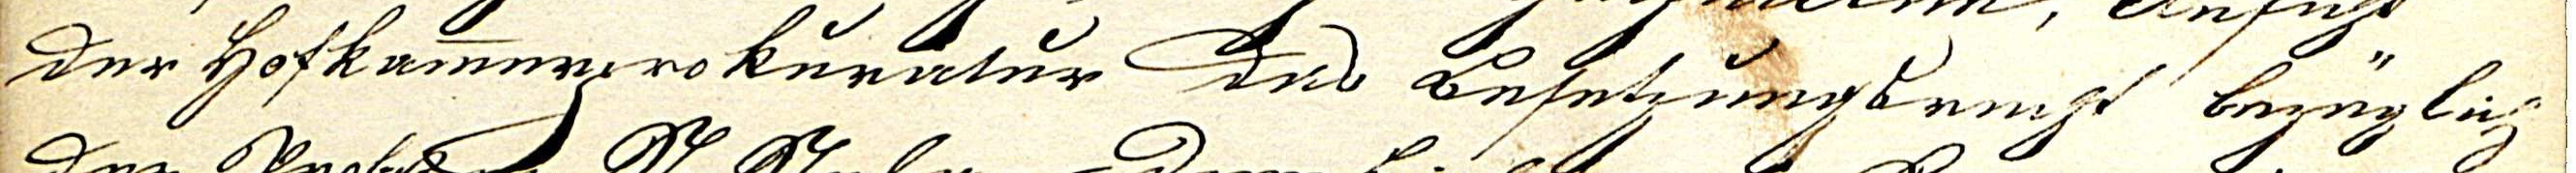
der Hofkammerprokuratur das Besetzungsrecht bezüglich
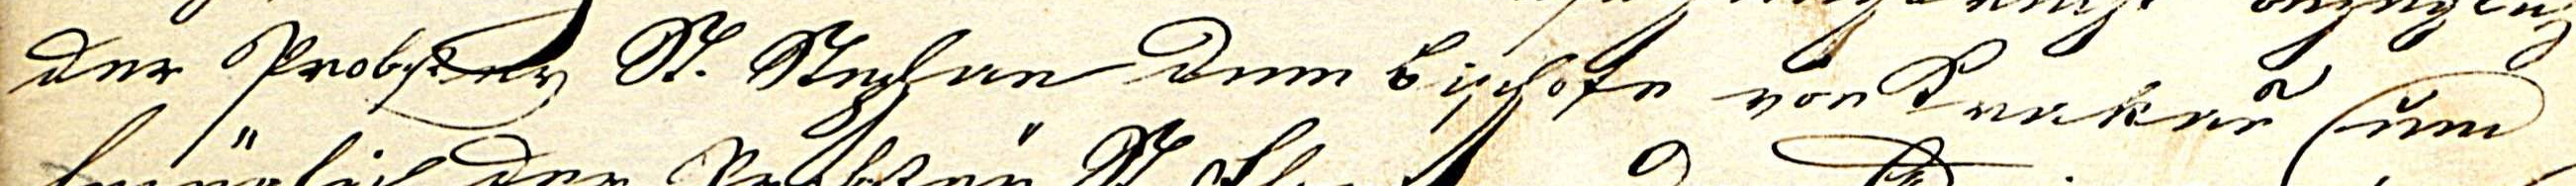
der Probstey St. Stephan dem Bischofe von Krakxxr und
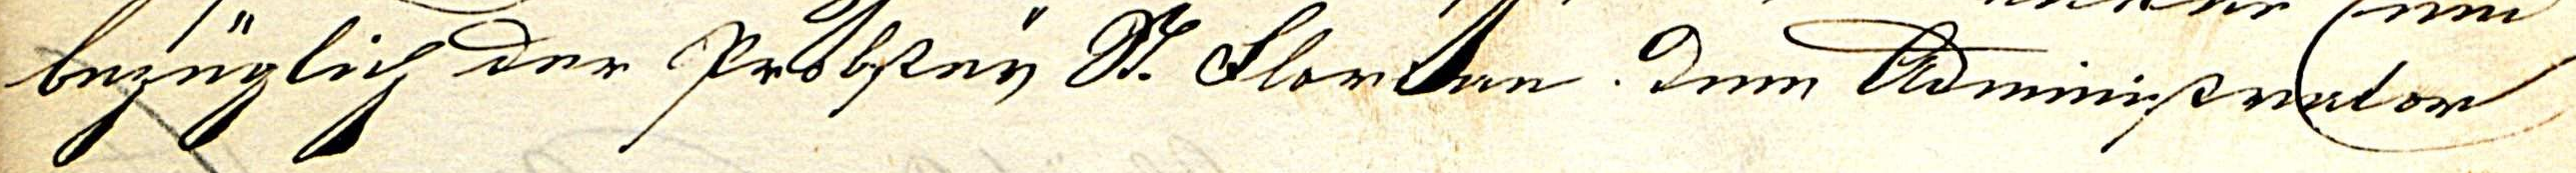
bezüglich der Probstey St. Florian dem Administrator
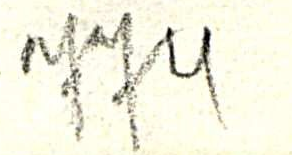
774
